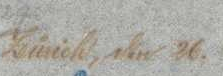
Zürich, den 26.
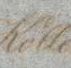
Eidg.
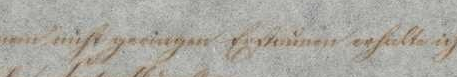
meinem nicht geringen Erstaunen erhalte ich
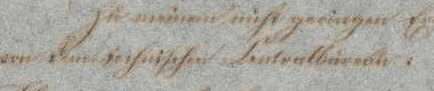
von dem technischen Centralbureau:
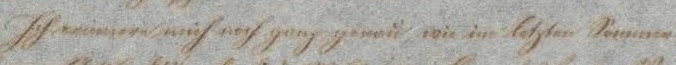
Ich erinnere mich noch ganz genau, wie im letzten Sommer,
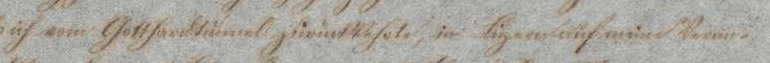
ich vom Gotthardtunnel zurückkehrte, in Luzern auf meine Veran-
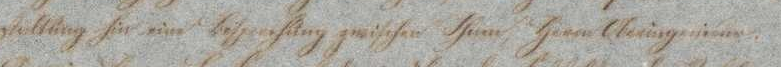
staltung hin eine Besprechung zwischen Ihnen, Herrn Oberingenieur
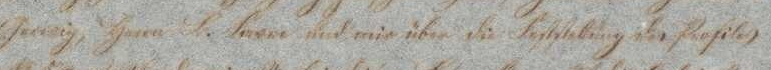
Gerwig, Herrn L. Favre und mir über die Feststellung des Profiles
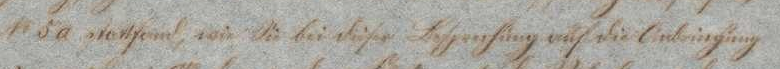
No 5a stattfand, wie Sie bei dieser Besprechung auf die Anbringung
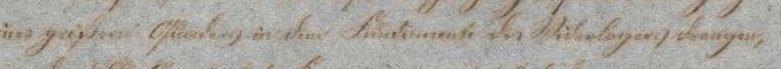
eines größern Quaders in dem Fundamente des Widerlagers drangen,
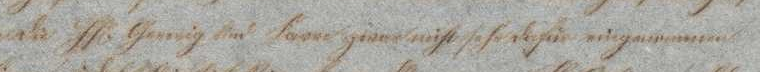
wie die HH. Gerwig und Favre zwar nicht sehr dafür eingenommen
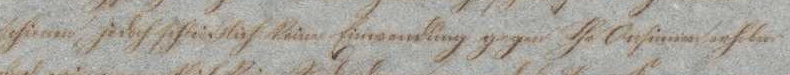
schienen, jedoch schließlich keine Einwendung gegen Ihr Ansinnen erhoben
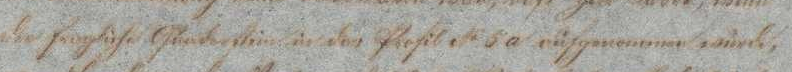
der fragliche Quaderstein in das Profil No 5a aufgenommen würde,
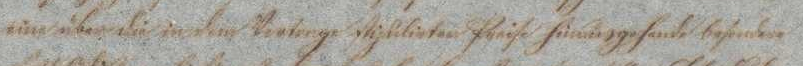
eine über die in dem Vertrage stipulirten Preise hinausgehende besondere
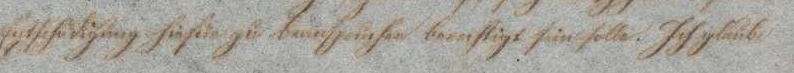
Entschädigung hiefür zu beanspruchen berechtigt sein solle. Ich glaube
